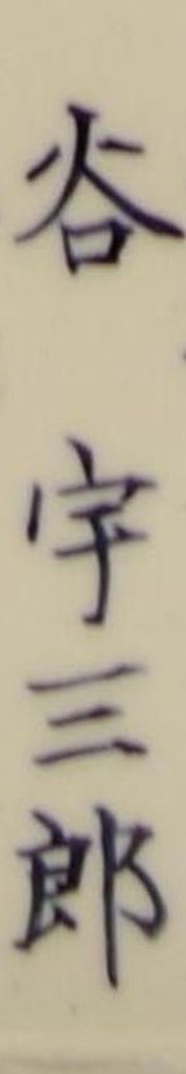谷宇三郎
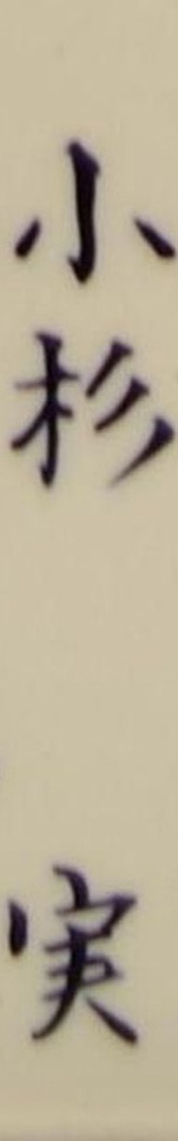小杉実
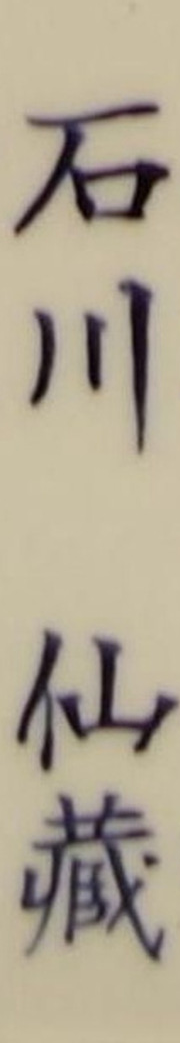石川仙蔵
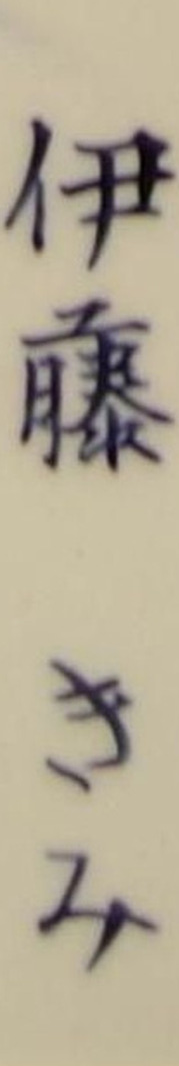伊藤きみ
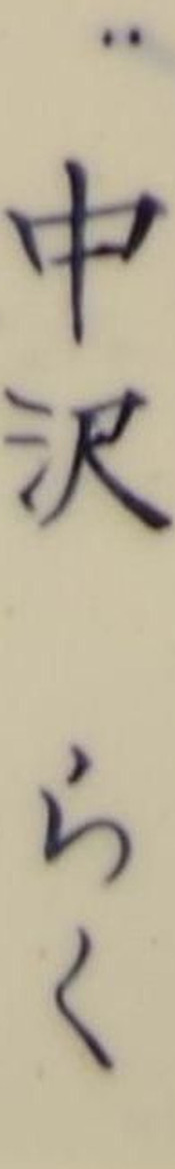中沢らく
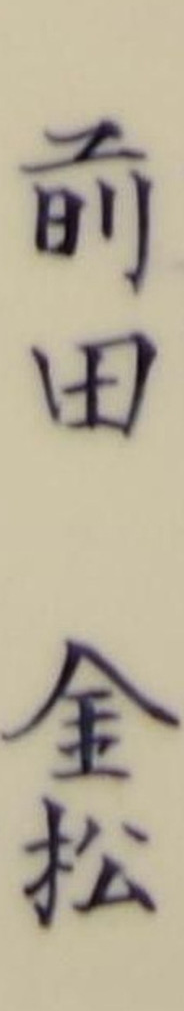前田金松
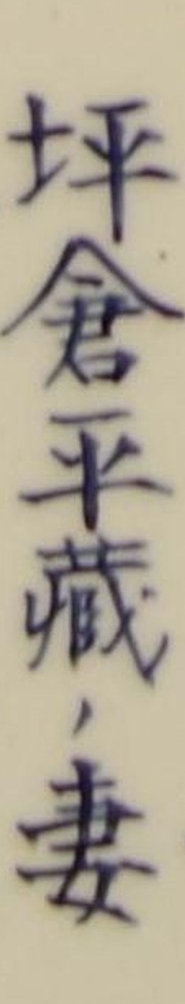坪倉平蔵ノ妻
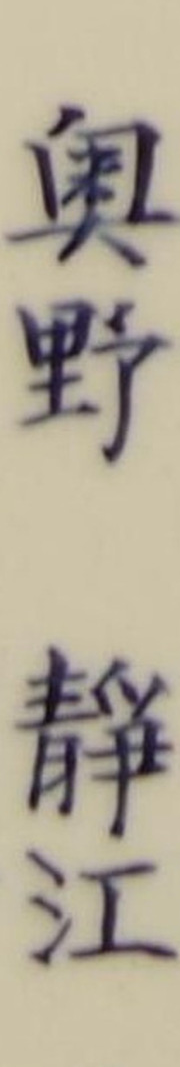奥野静江
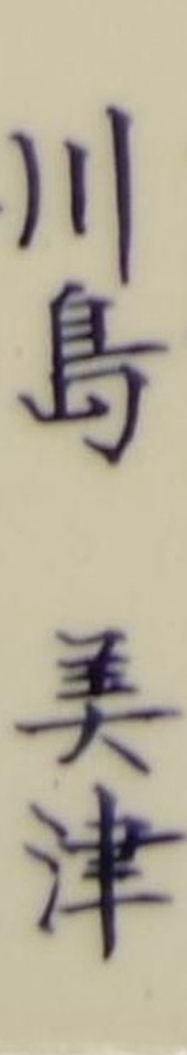川島美ノ
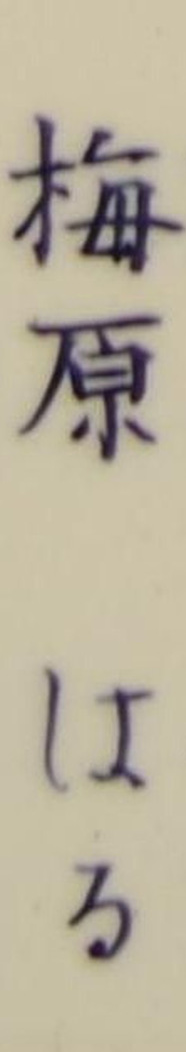梅原はる
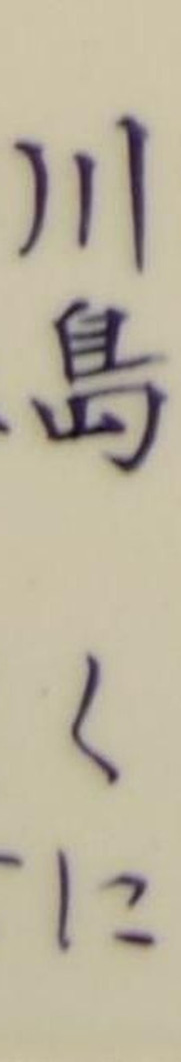川島くに
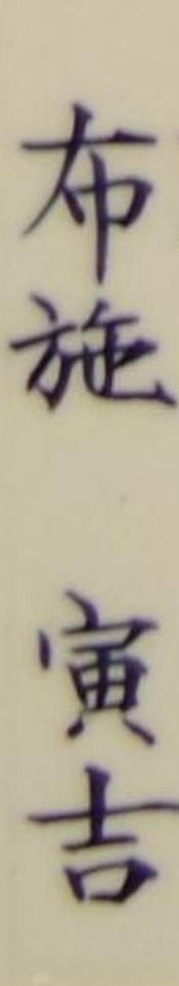布施寅吉

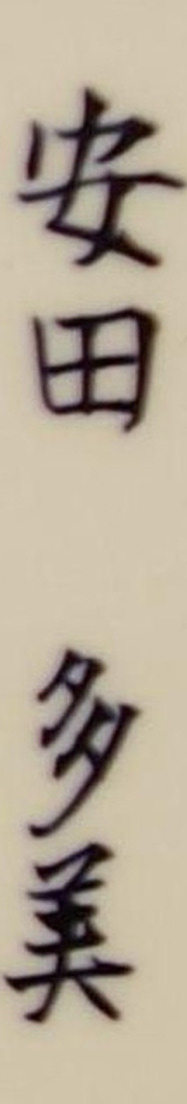安田多美
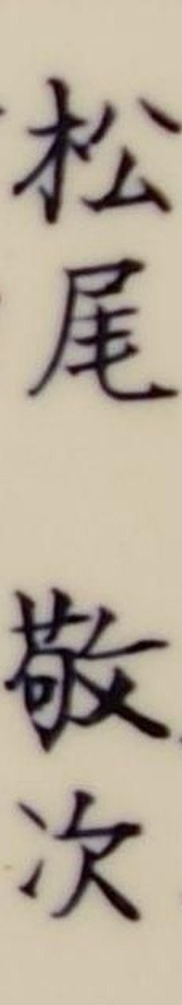松尾敬次
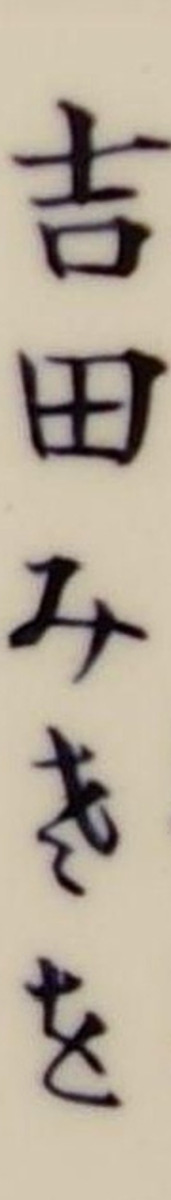吉田みきを
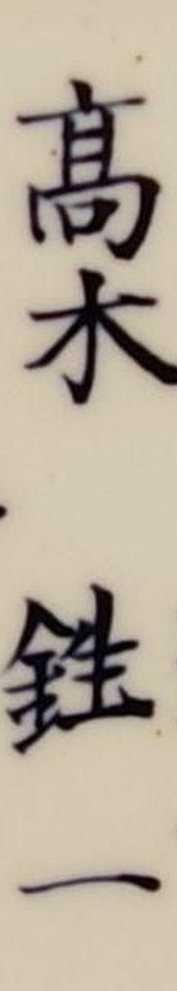高木鉎一
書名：A~D
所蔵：koyasan kongobuji
